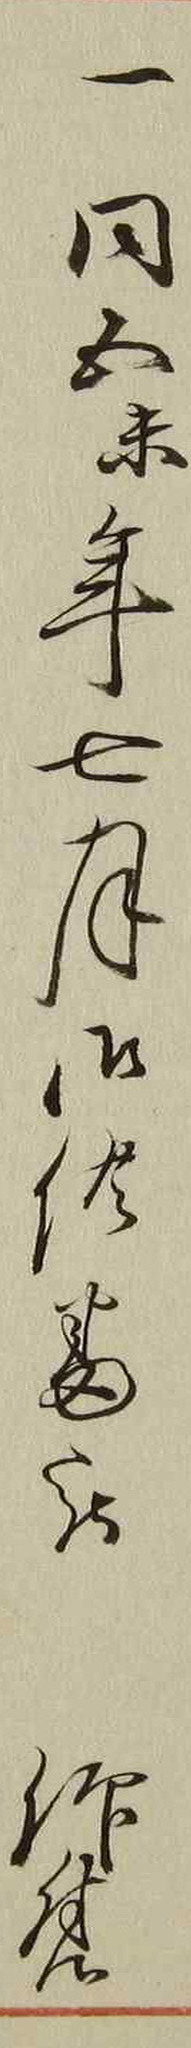一同五未年七月御供番被仰付候
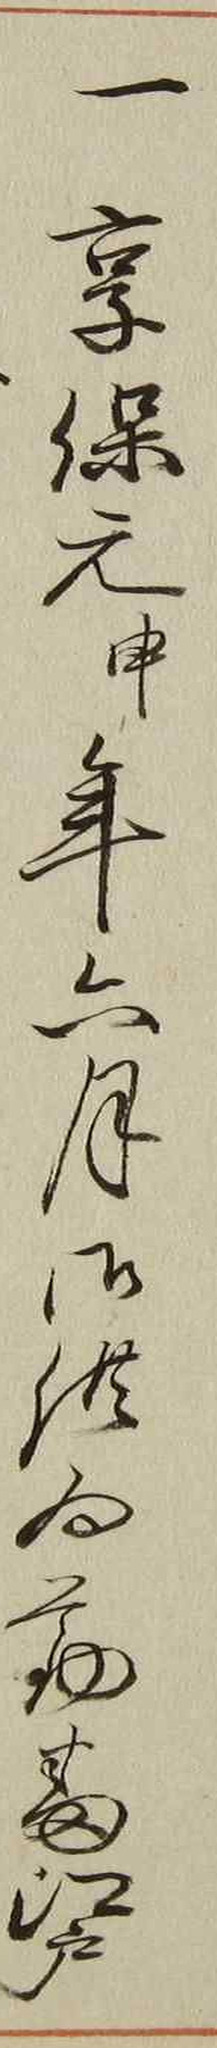一享保元申年六月御供為勤番江戸
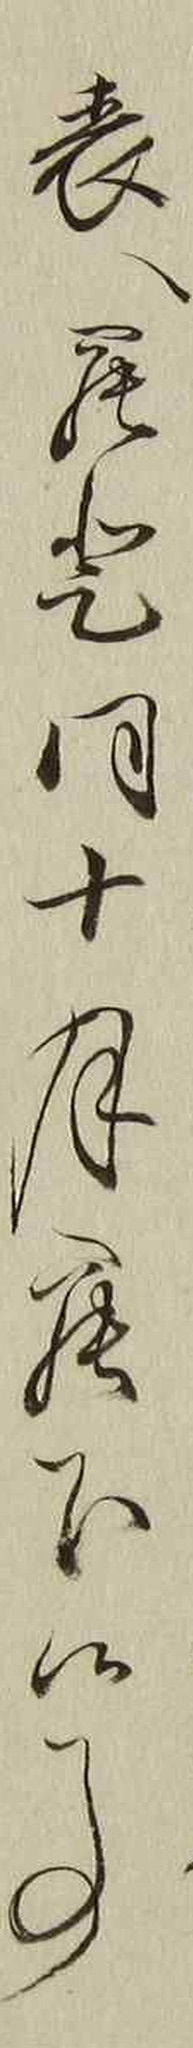表へ罷登同十月罷下候事
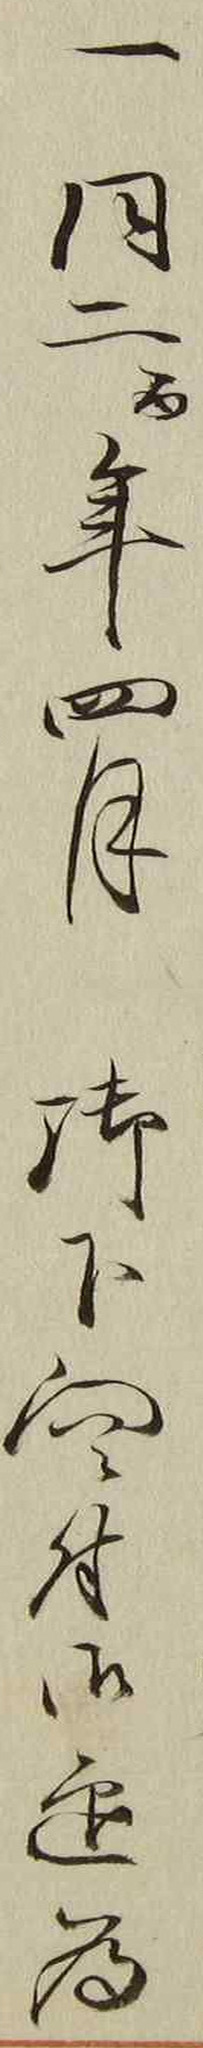一同二酉年四月御下向ニ付御迎為
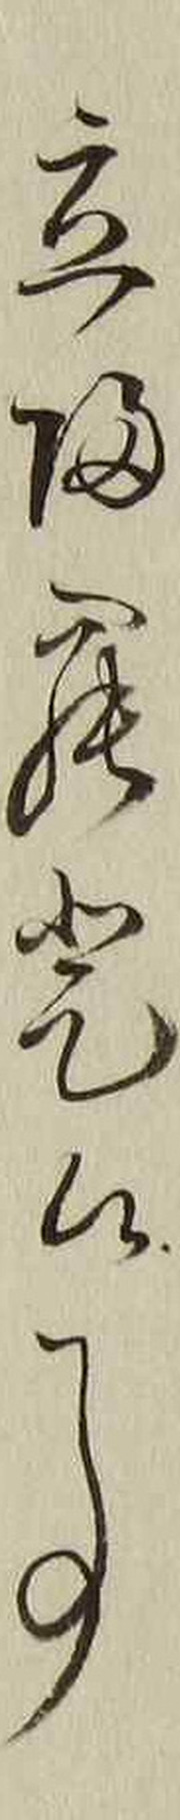立帰罷登候事
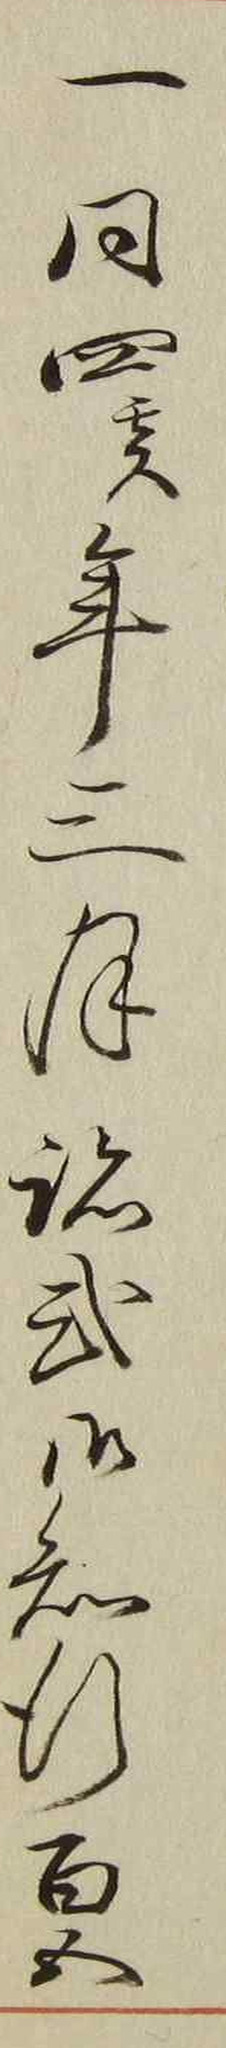一同四亥年三月跡式御知行百五
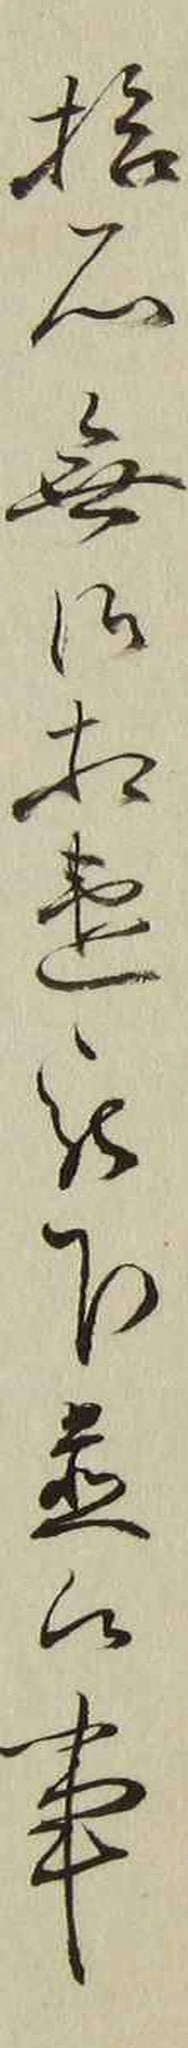拾石無御相違被下置候事
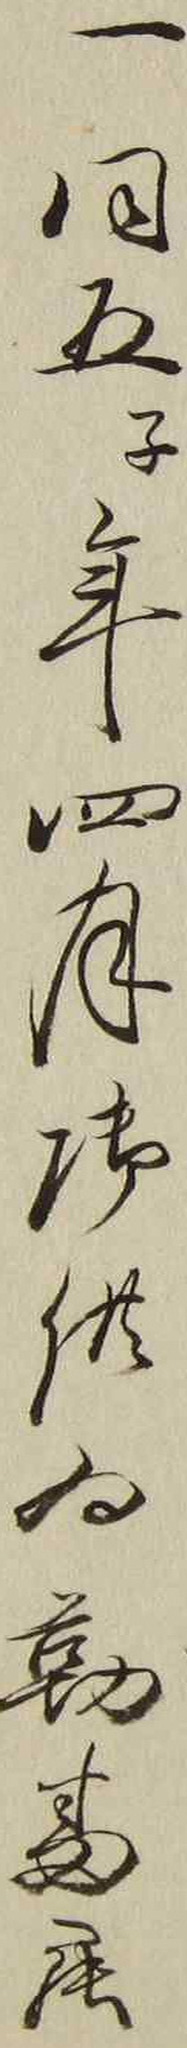一同五子年四月御供為勤番罷
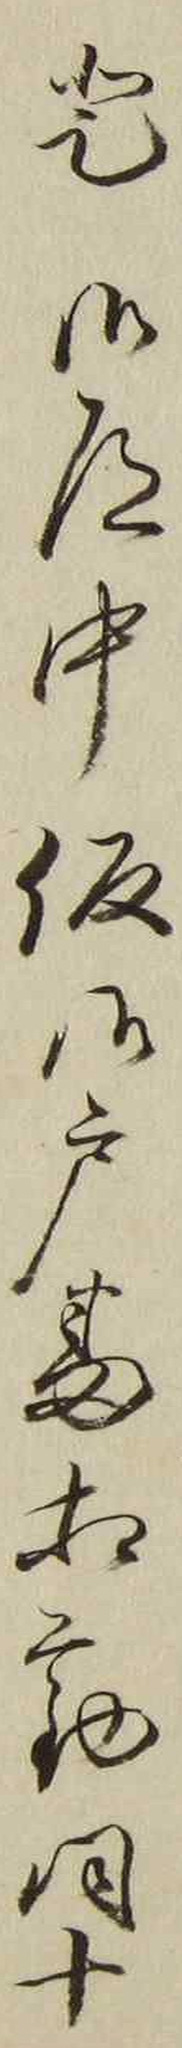登御道中仮江戸番相勤同十

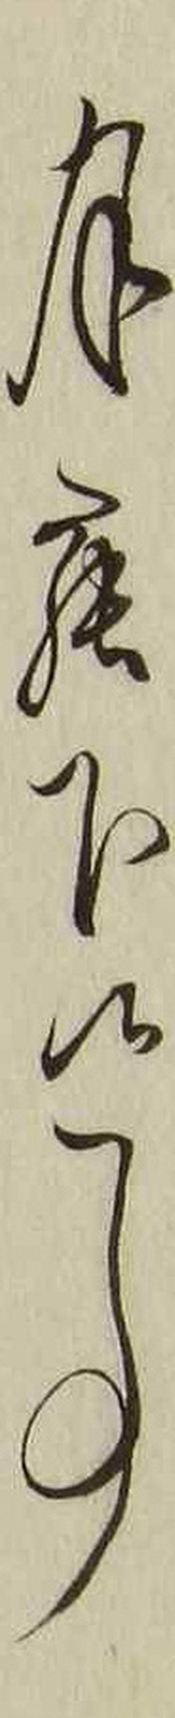月罷下候事
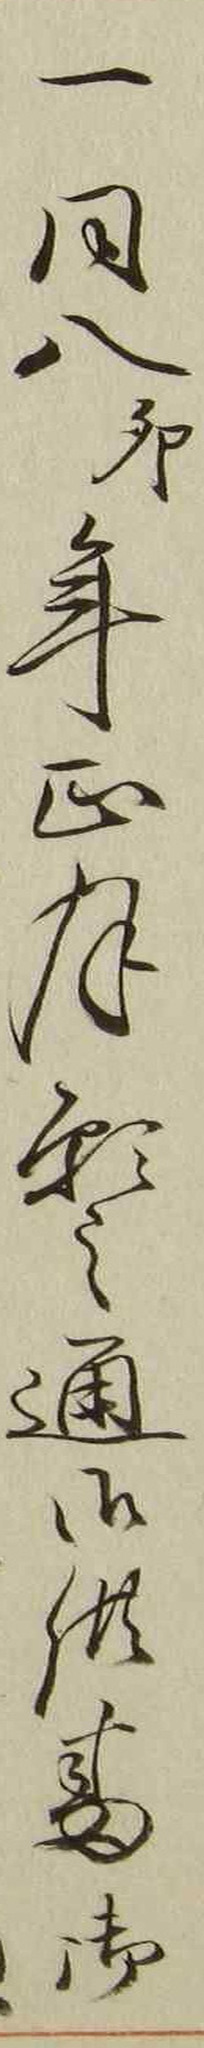一同八卯年正月願之通御供番御
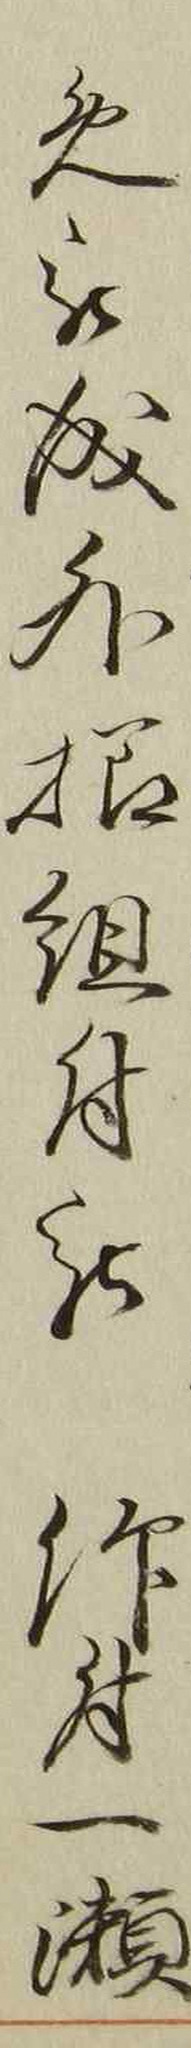免被成外様組付被仰付一瀬
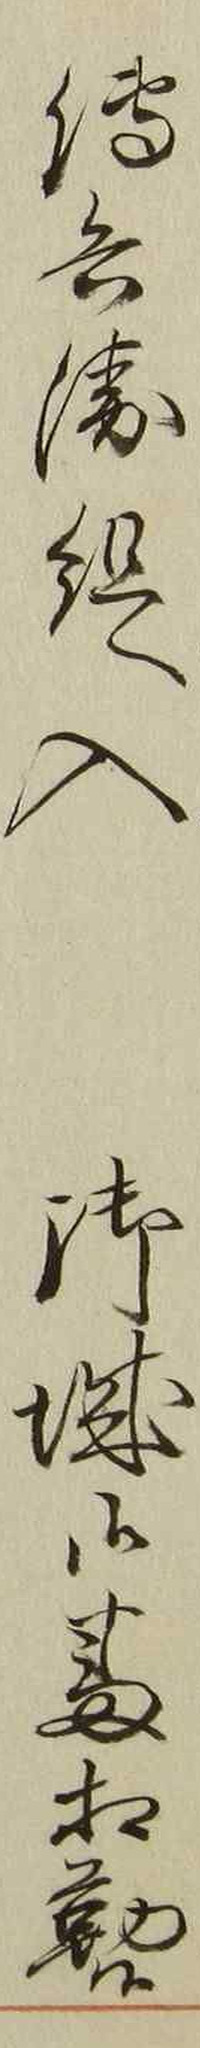傳兵衛組へ入御城御番相勤候
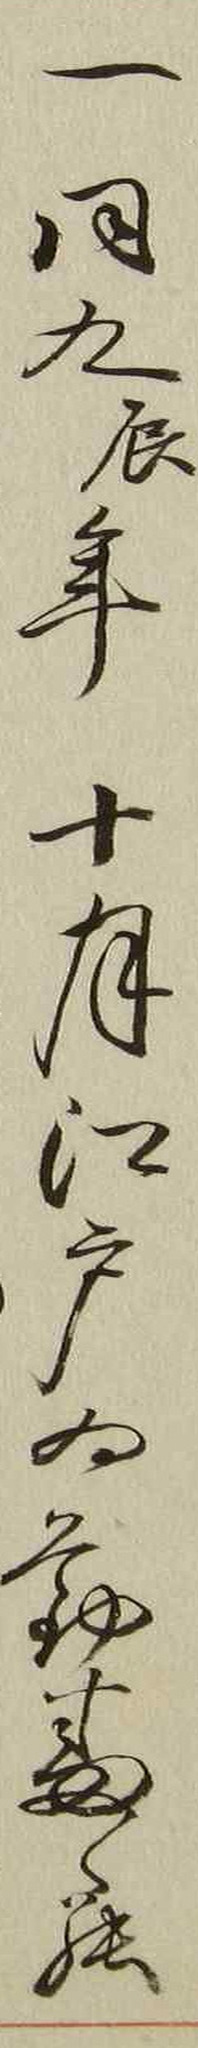一同九辰年十月江戸為勤番罷
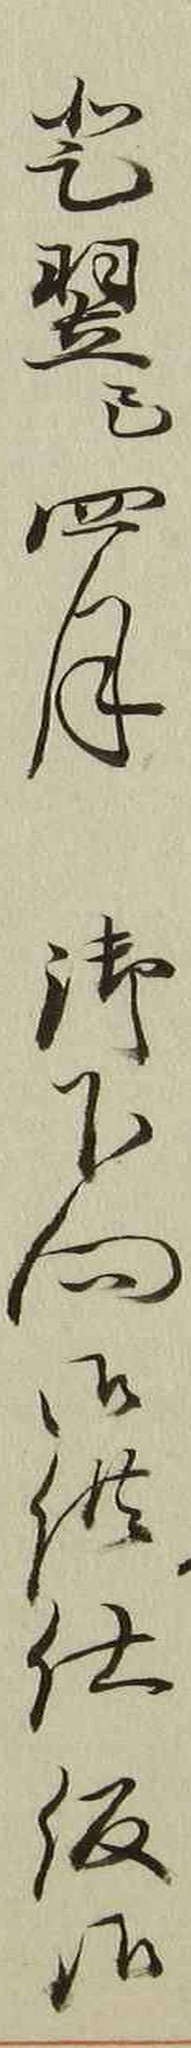登翌巳四月御下向御供仕仮御
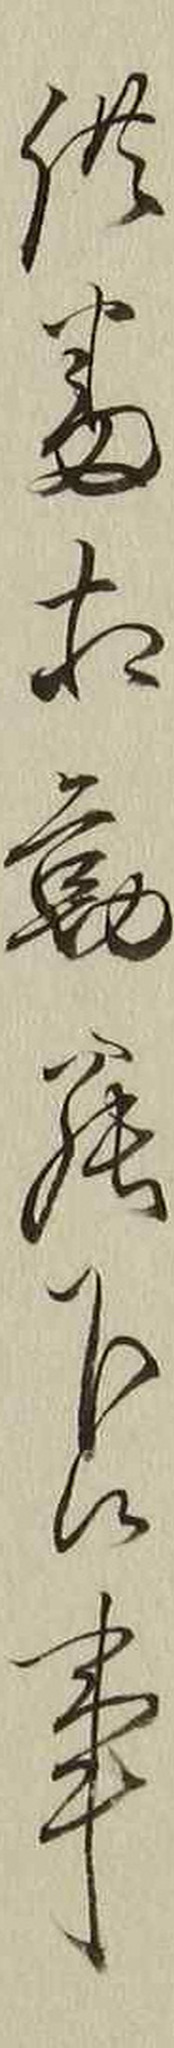供番相勤罷下候事
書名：諸士系譜　巻之54　ほ之部1
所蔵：会津若松市立会津図書館
